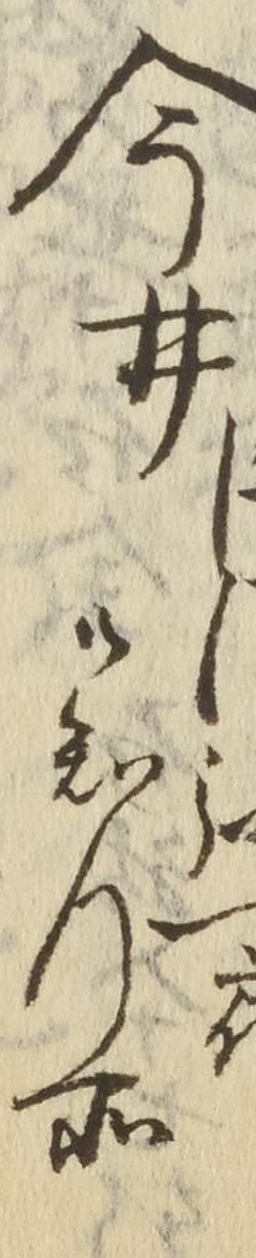古田御知行所
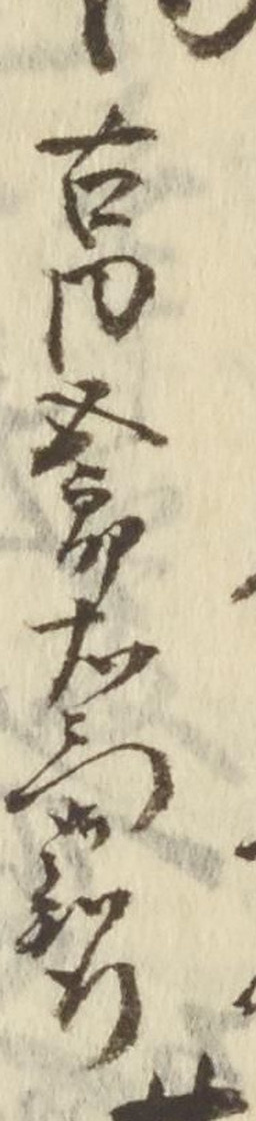古田五郎右衛門知行所
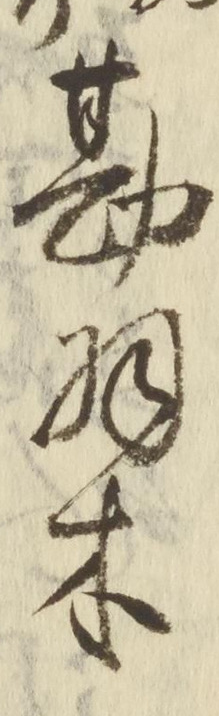勘羽木
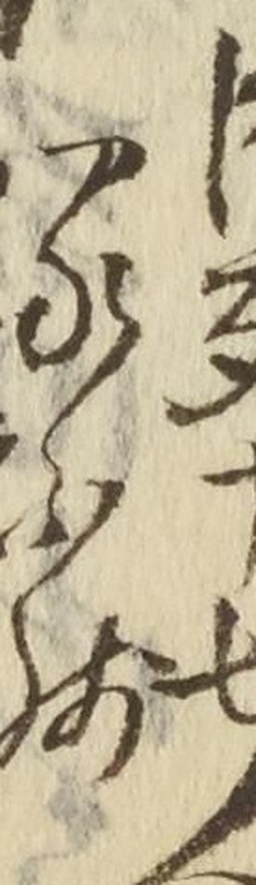家不残
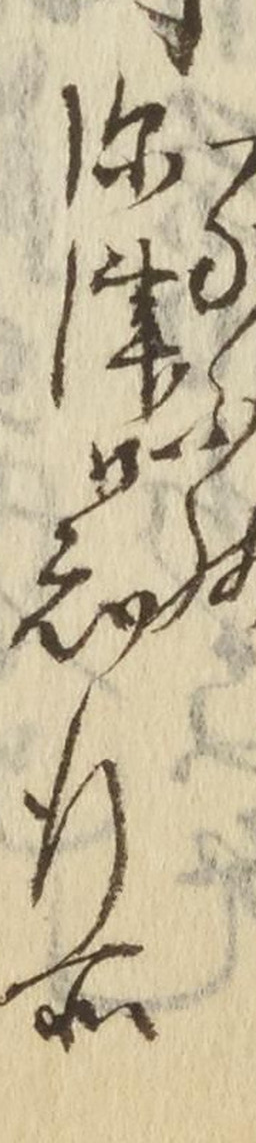深津御知行所
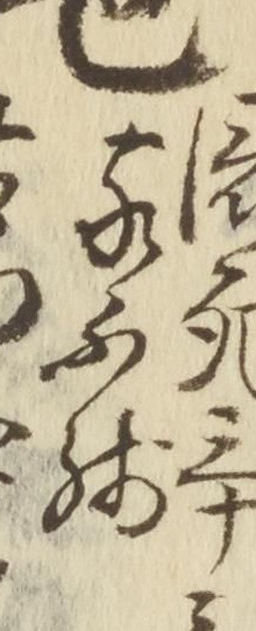家不残
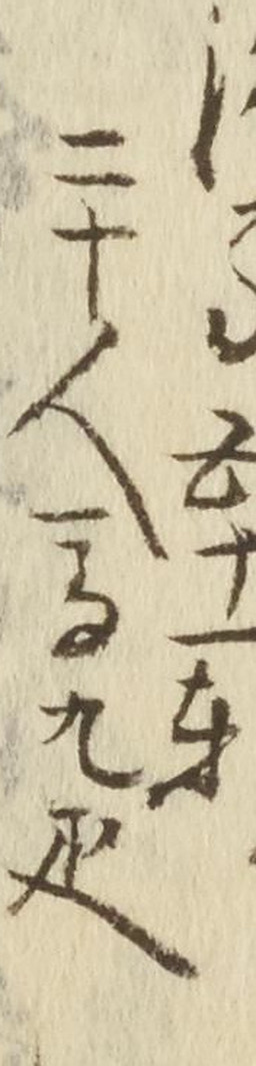二十人馬九疋
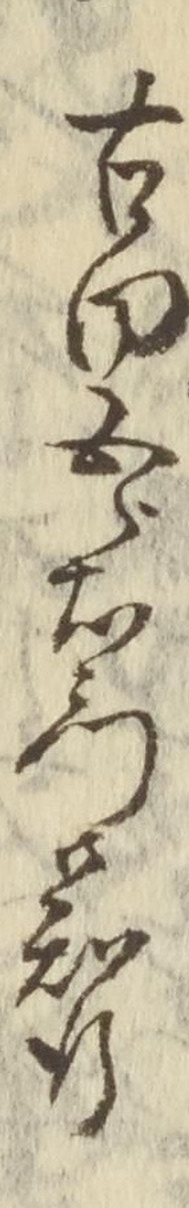古田五郎右衛門知行所
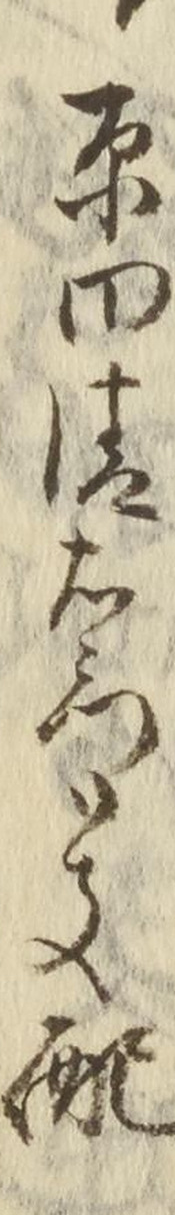原田清右衛門御支配
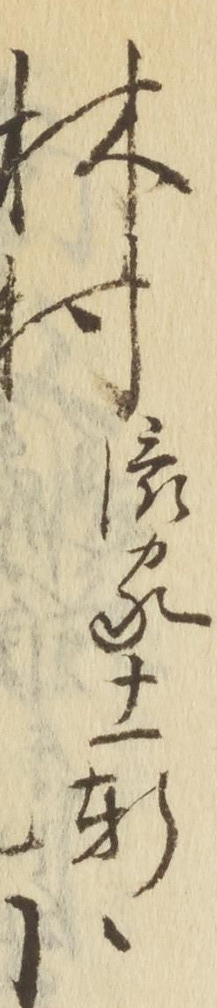林村流家十一軒
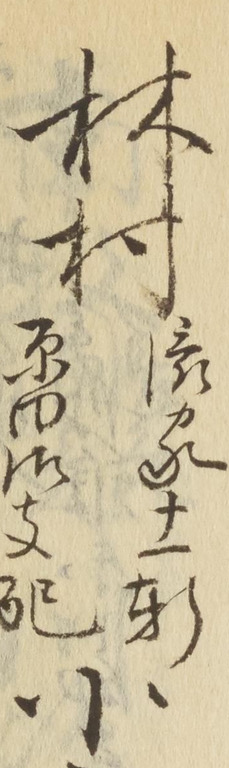林村流家十一軒
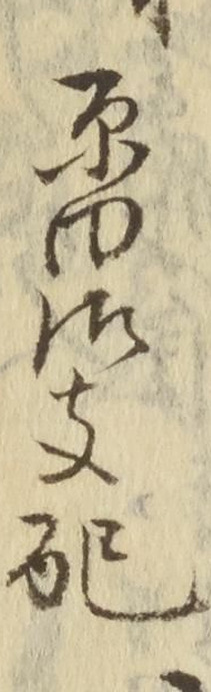原田御支配
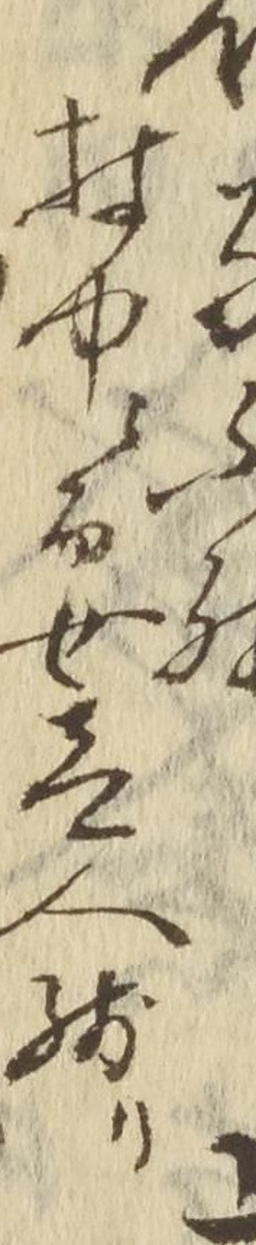村中二而女壱人残り
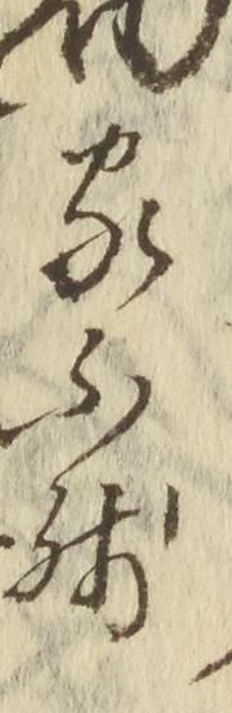家不残
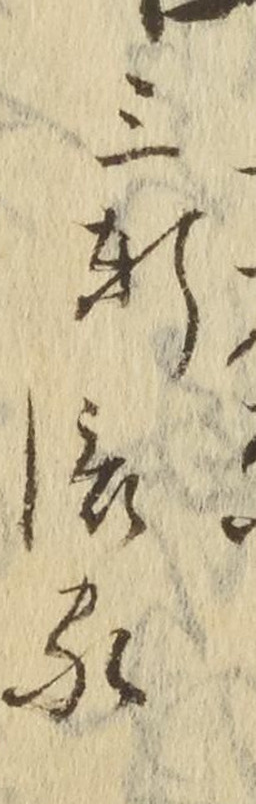三軒流家
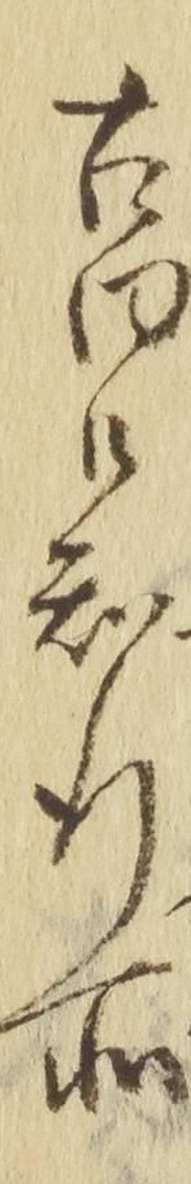古田御知行所
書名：浅間大變記
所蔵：東京大学地震研究所図書室 Earthquake Research Institute Library, The University of Tokyo, JAPAN
